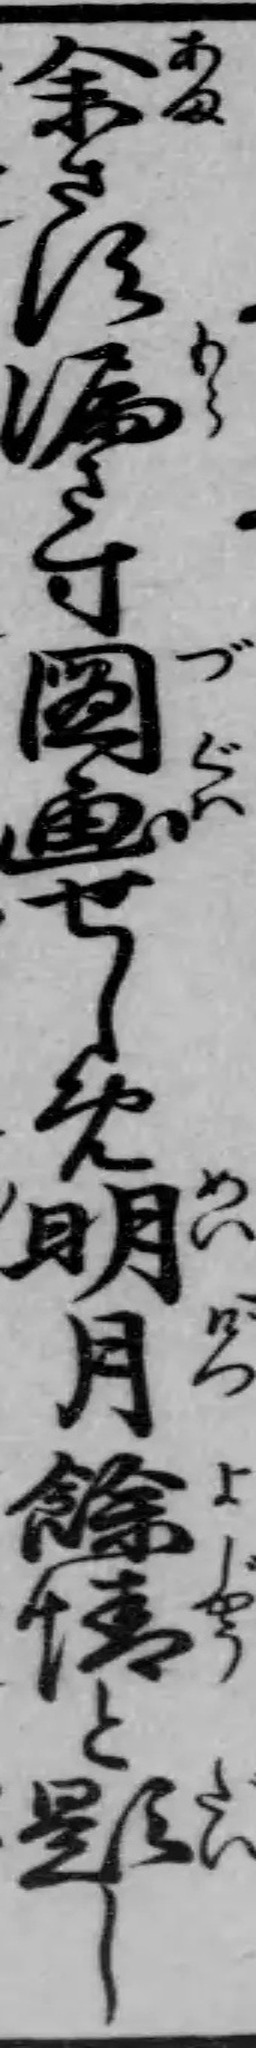余さす漏さす図画せしめ明月余情と題し
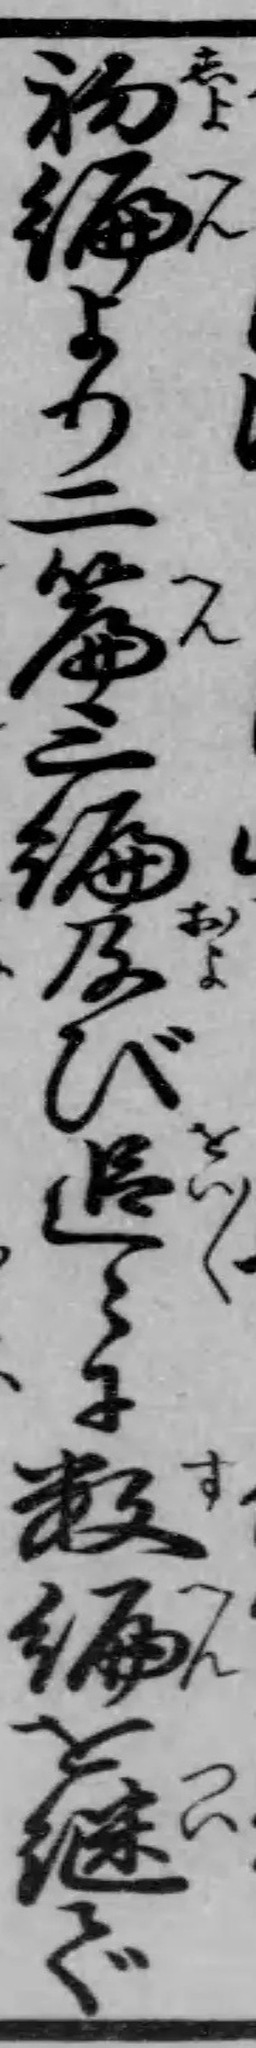初編より二篇三編及び追々に数編を継で
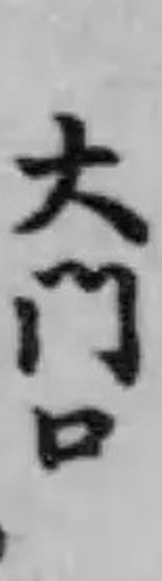大門口
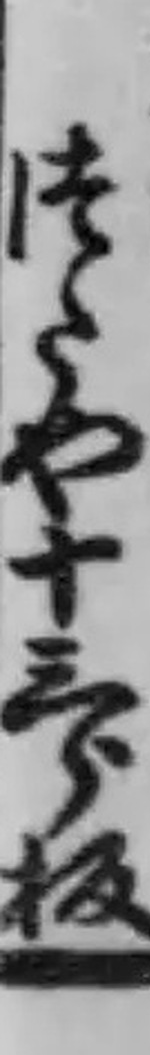つたや十三郎板
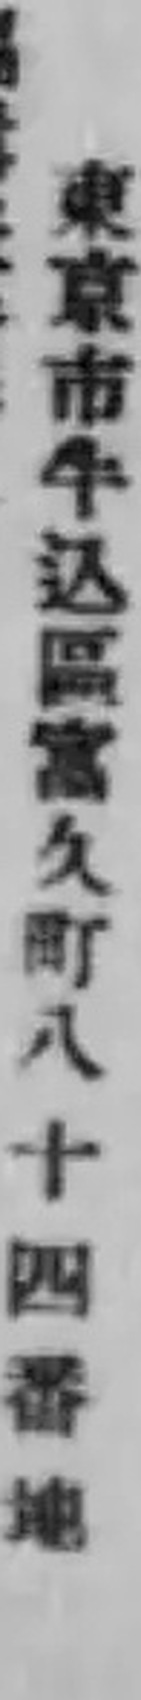東京市牛込区富久町八十四番地
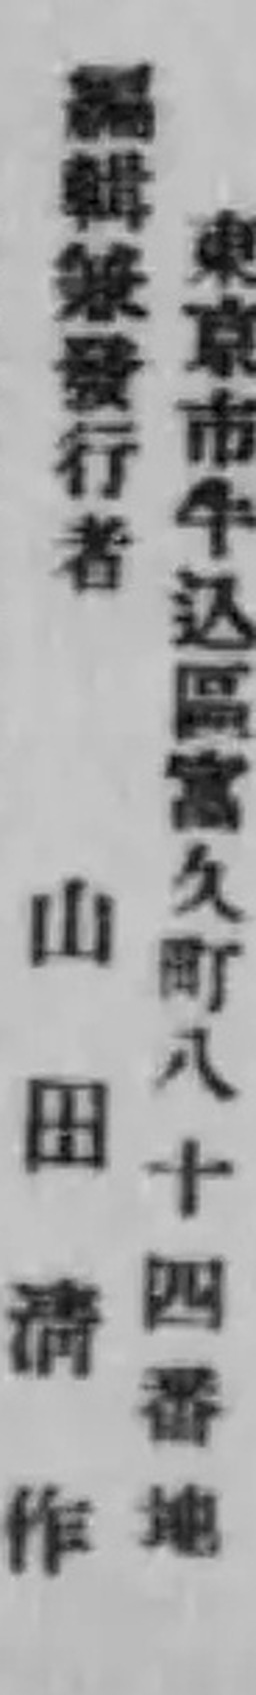編輯兼発行者山田清作
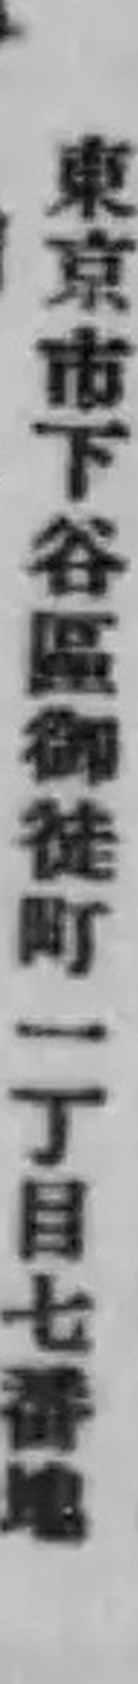東京市下谷区御徒町一丁目七番地
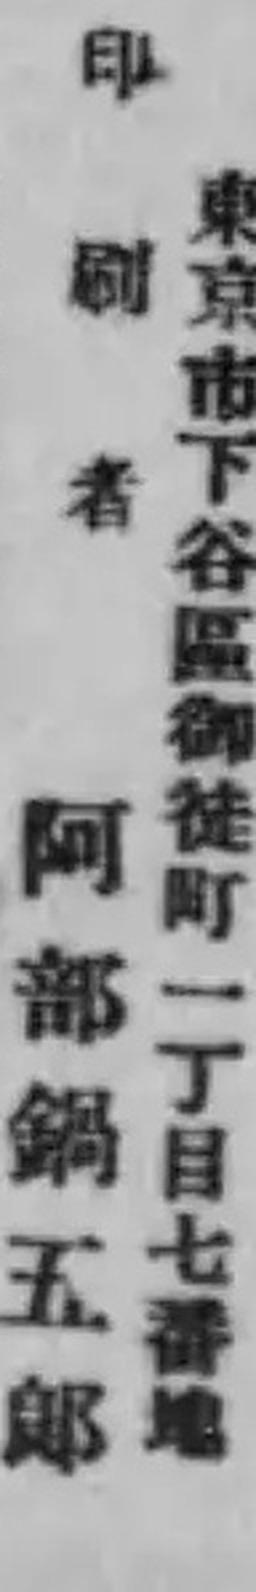印刷者阿部鍋五郎
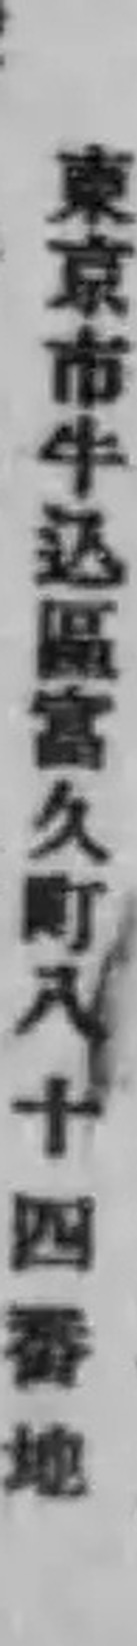東京市牛込区富久町八十四番地
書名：明月余情. 第1編
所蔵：国立国会図書館 National Diet Library, JAPAN
